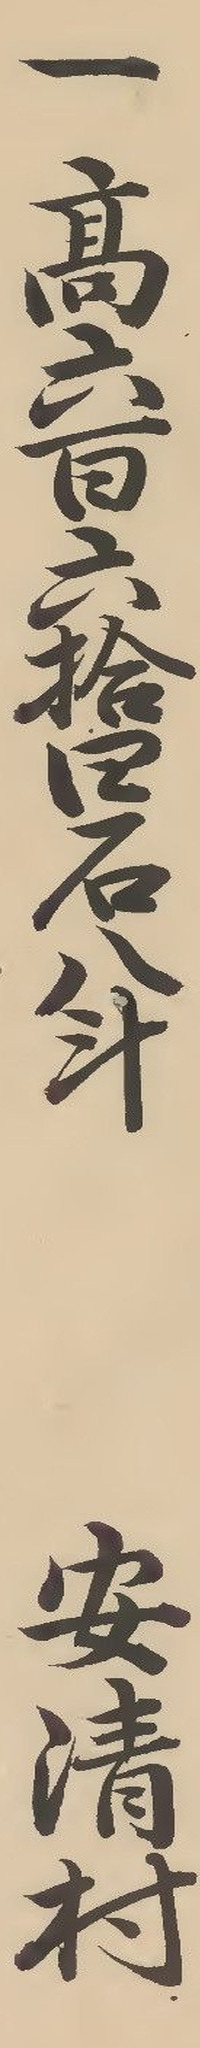一高六百六拾四石八斗安清村
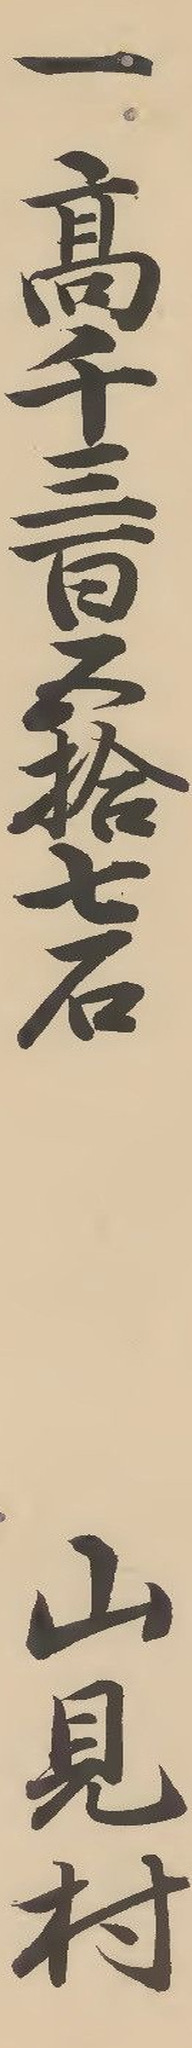一高千三百五拾七石山見村
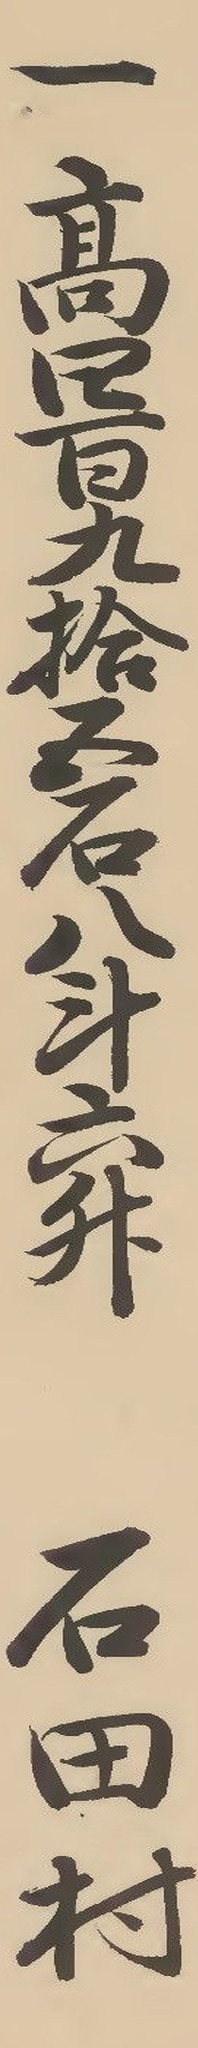一高四百九拾五石八斗六升石田村
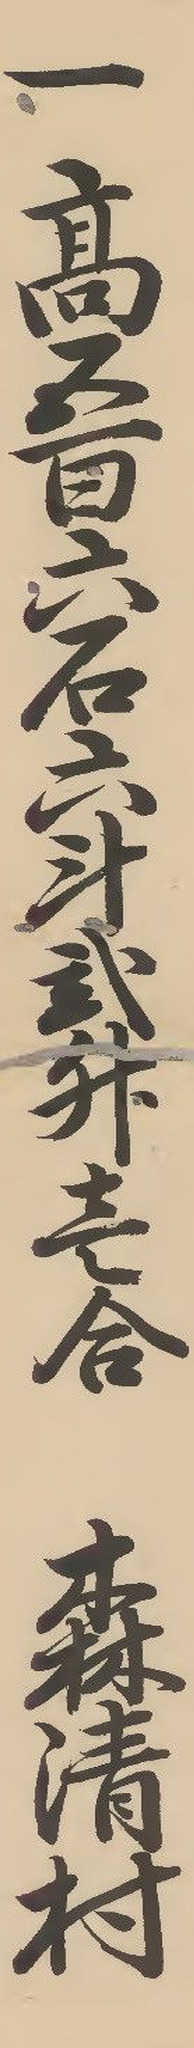一高五百六石六斗弐升壱合森清村

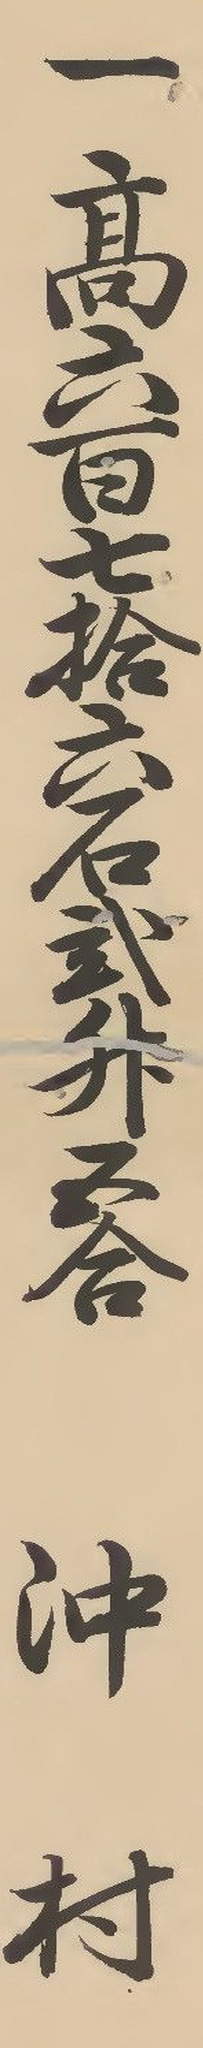一高六百七拾六石弐升五合沖村
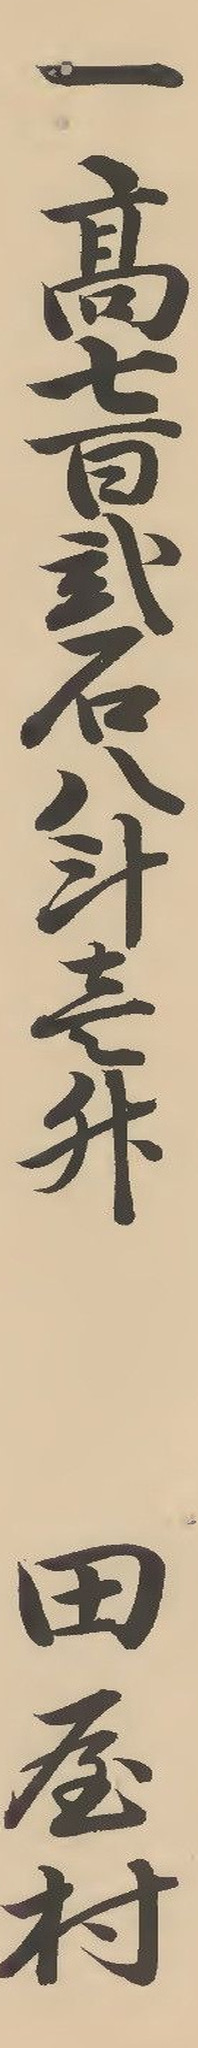一高七百弐石八斗壱升田屋村
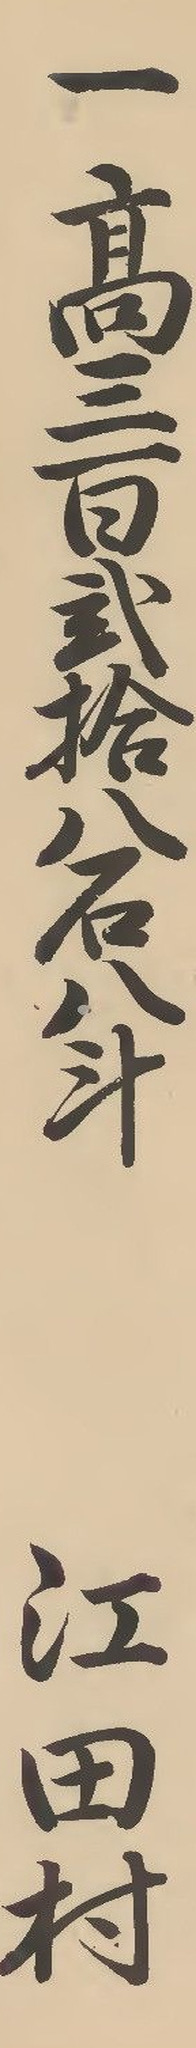一高三百弐拾八石八斗江田村
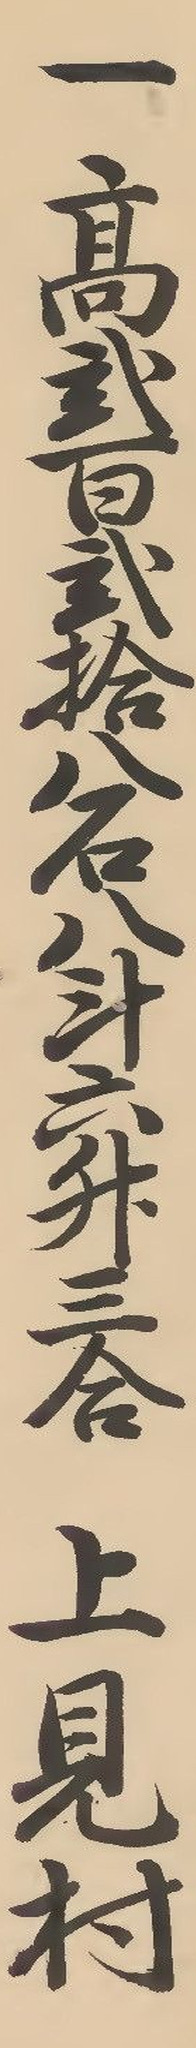一高弐百弐拾八石八斗六升三合上見村
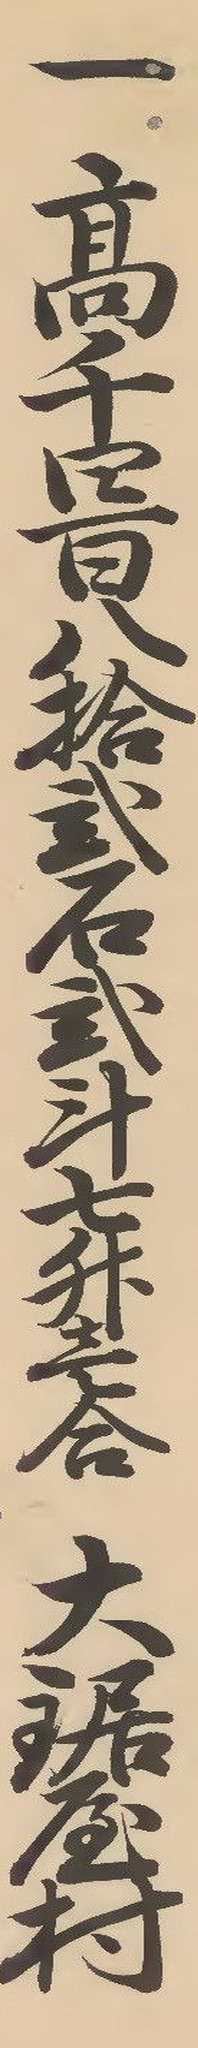一高千四百八拾弐石弐斗七升壱合大鋸屋村
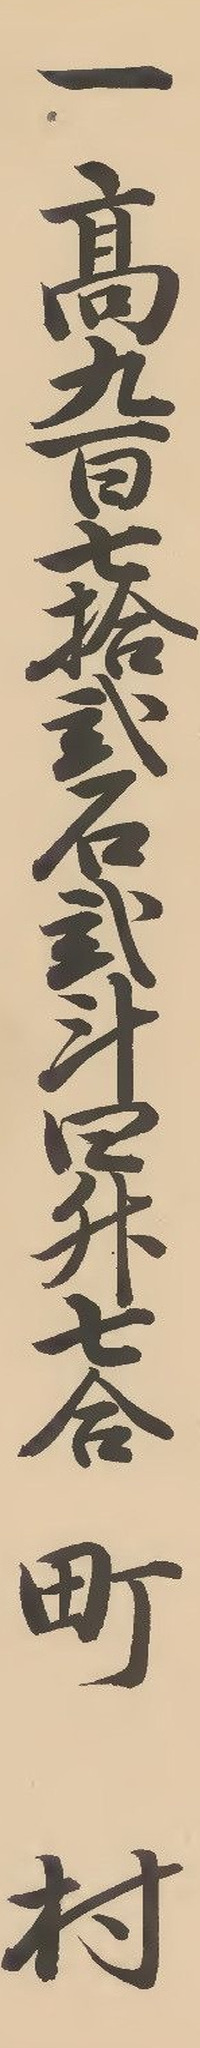一高九百七拾弐石弐斗四升七合町村
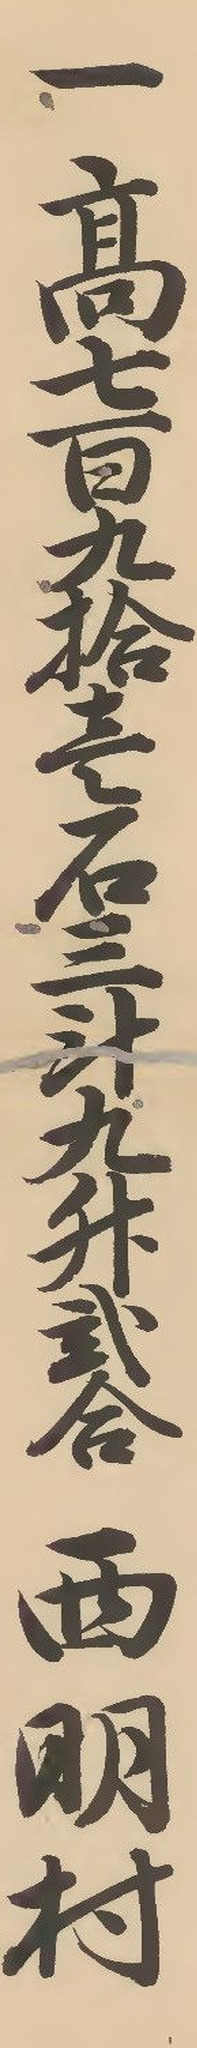一高七百九拾壱石三斗九升弐合西明村

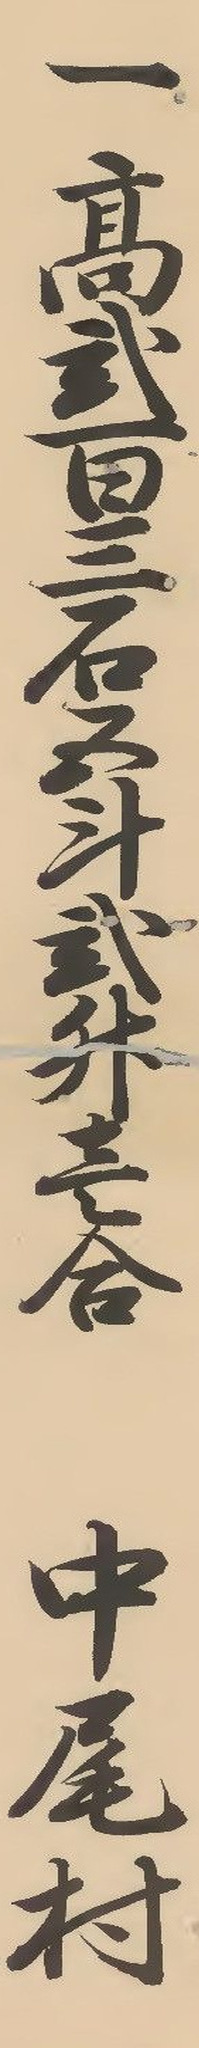一高弐百三石五斗弐升壱合中尾村
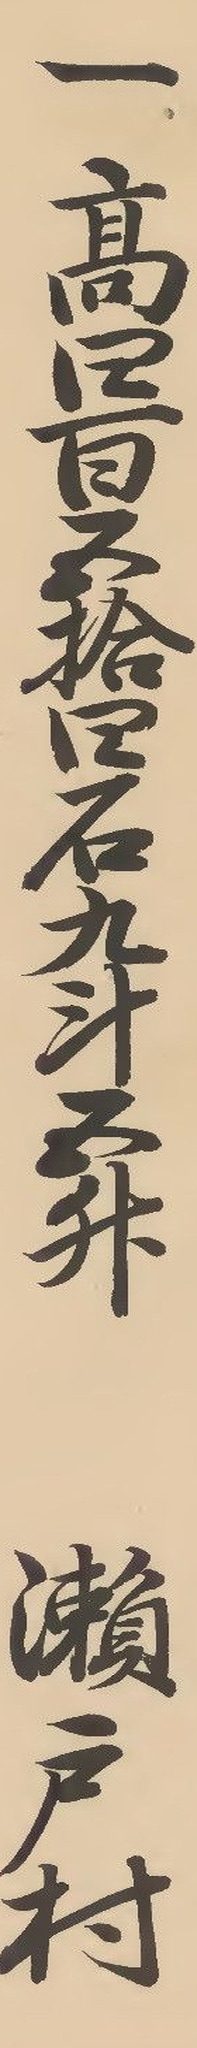一高四百五拾四石九斗五升瀬戸村
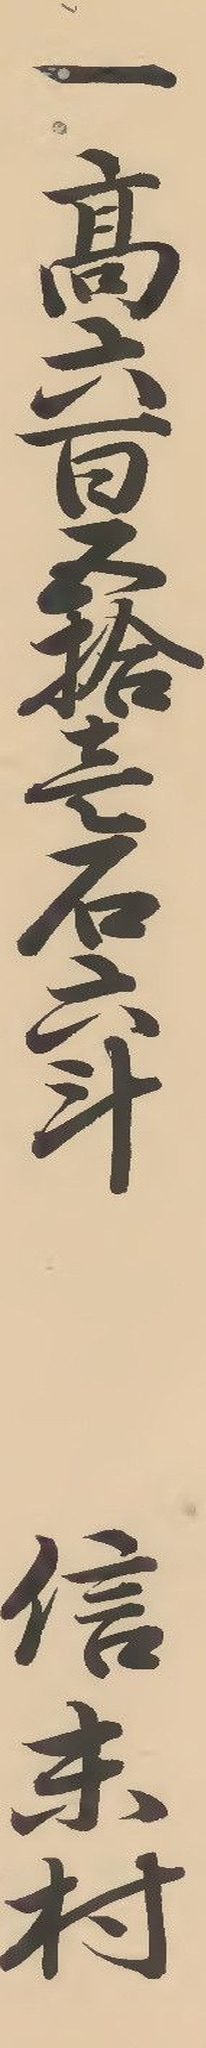一高六百五拾壱石六斗信未村
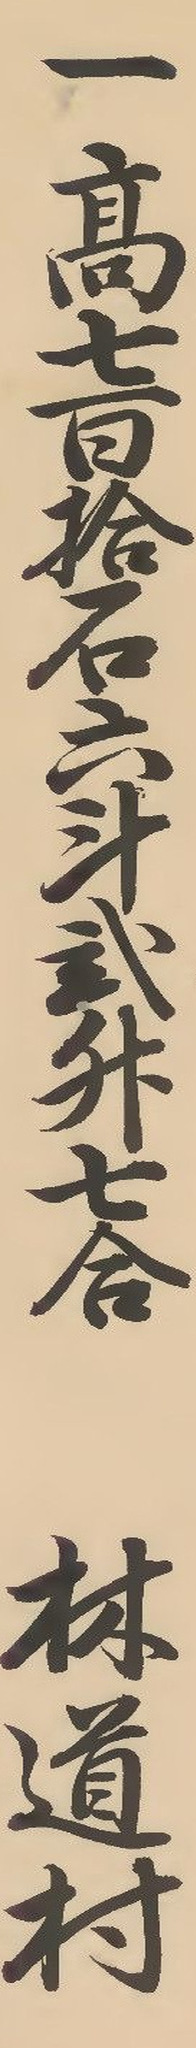一高七百拾石六斗弐升七合林道村
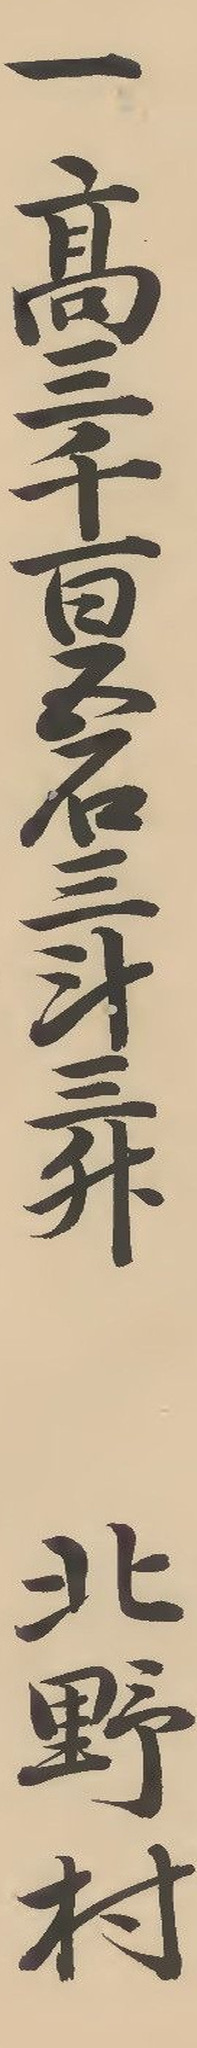一高三千百五石三斗三升北野村
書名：越中国郷帳
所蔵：国立公文書館 National Archives of Japan
